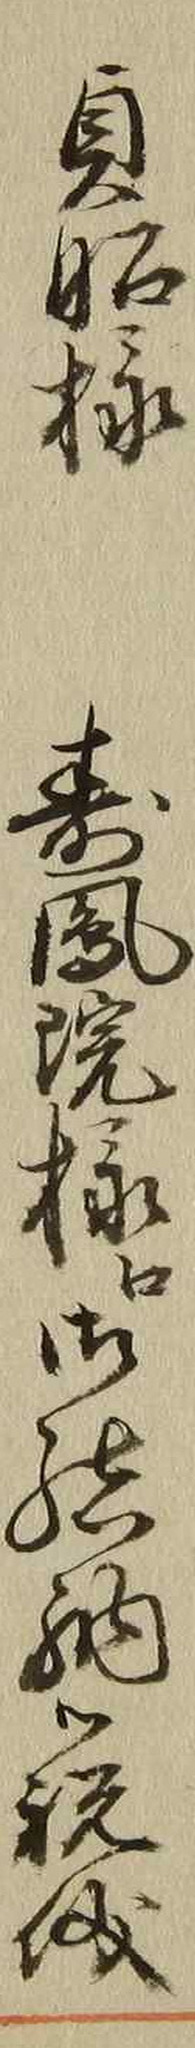貞昭様寿鳳院様江御結納御祝儀
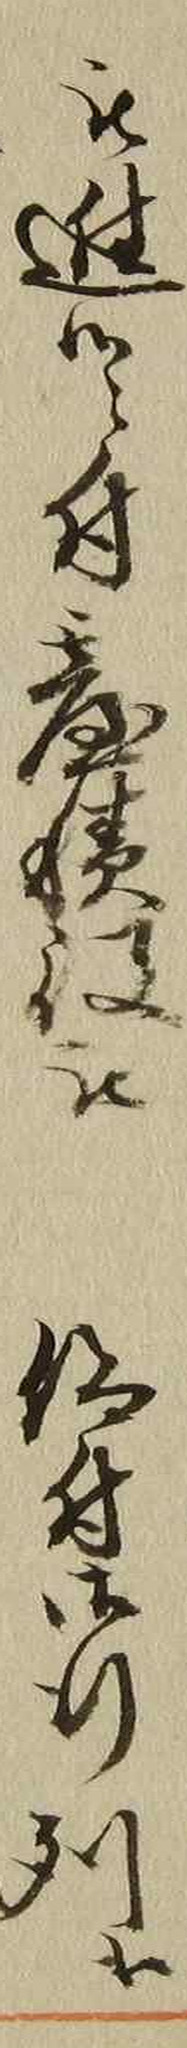被進候ニ付台積役被仰付御行列江
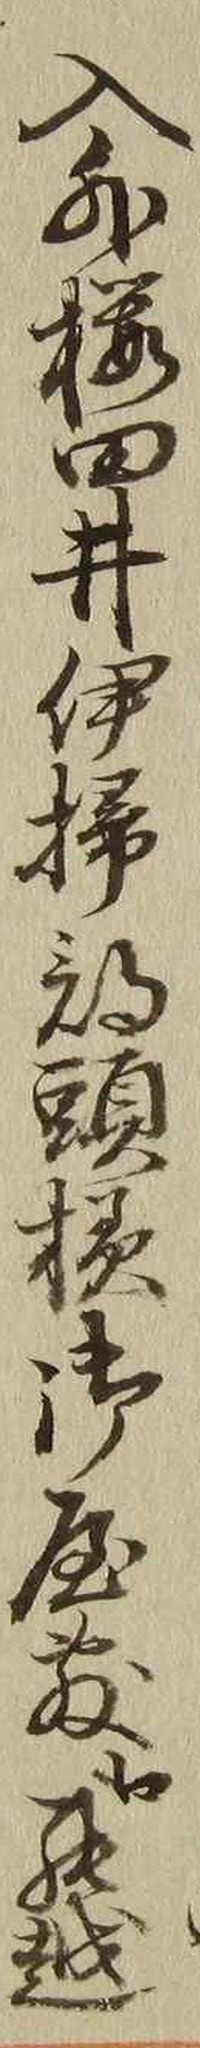入外桜田井伊掃部頭様御屋敷江罷越
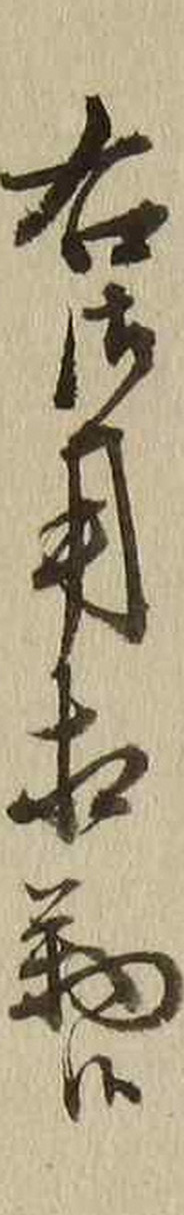右御用相勤候
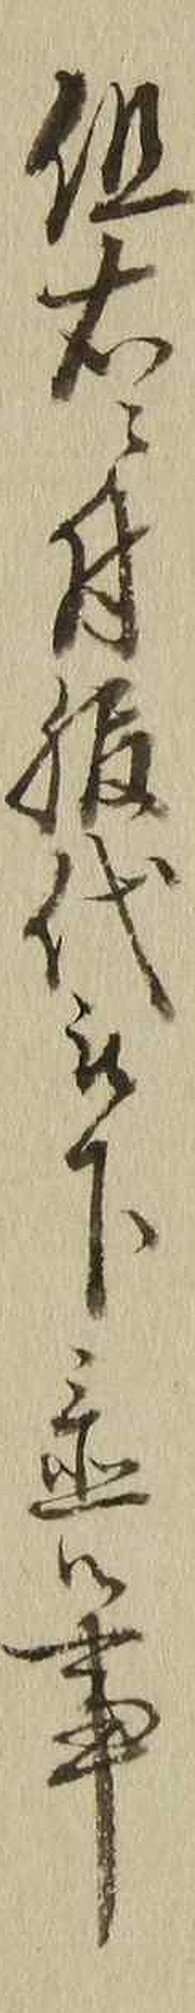但右ニ付服代被下置候事
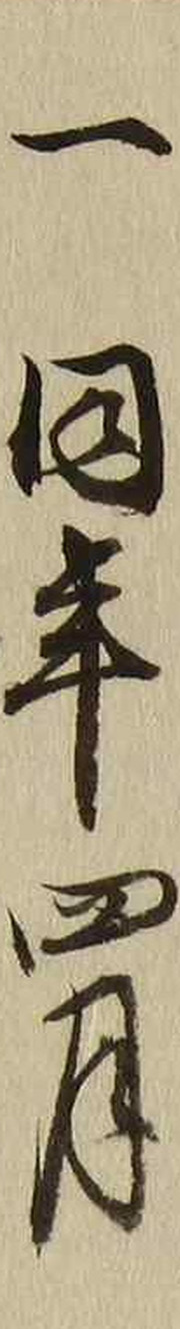一同年四月
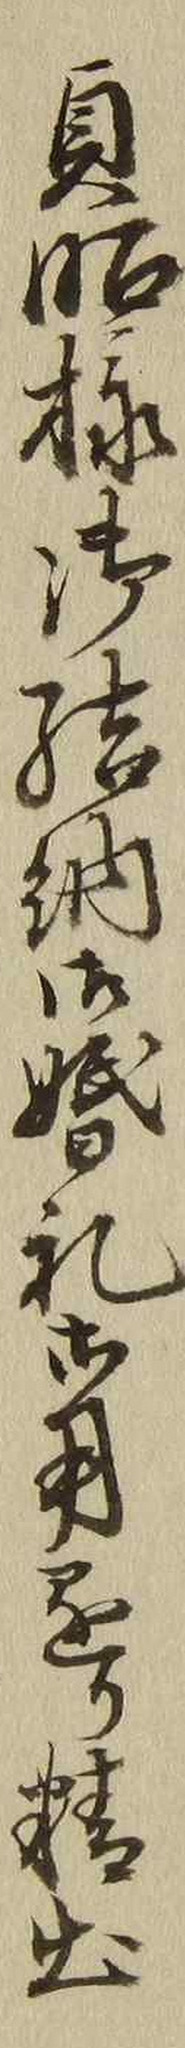貞昭様御結納御婚礼御用懸り精出
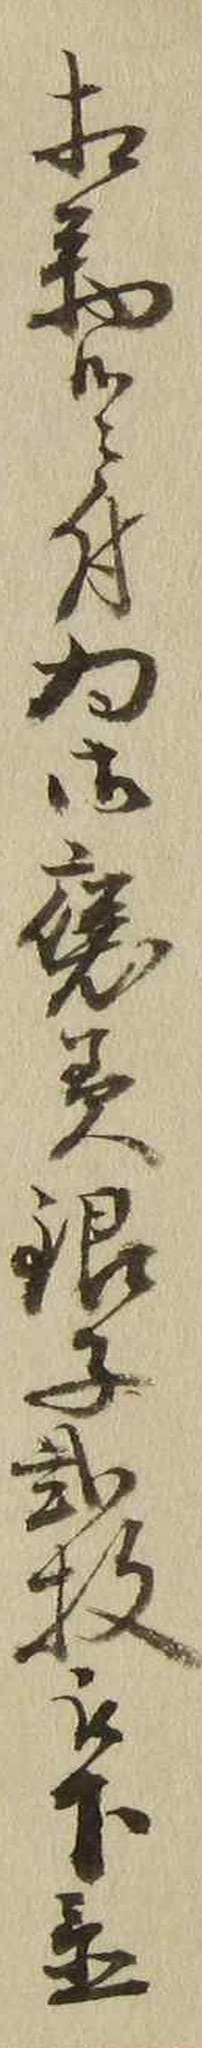相勤候ニ付為御褒美銀子弐枚被下置

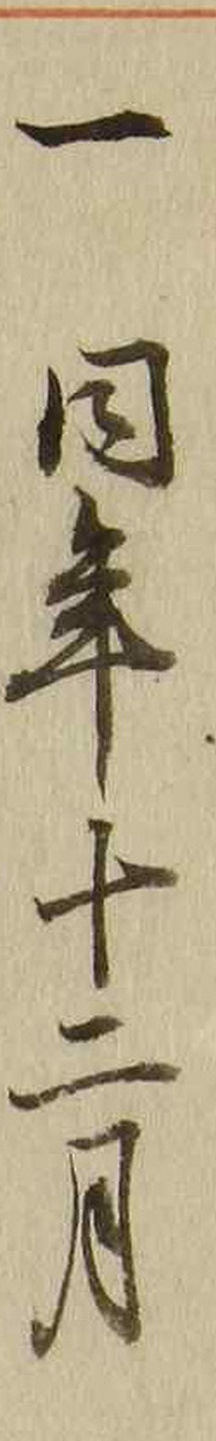一同年十二月
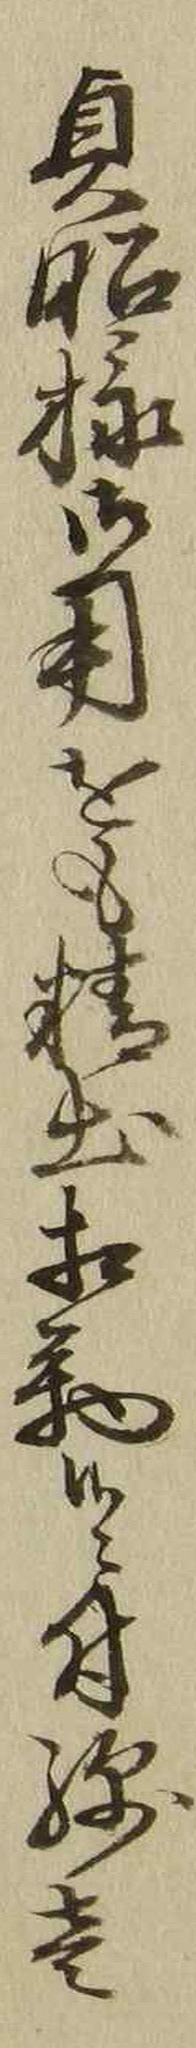貞昭様御用をも精出相勤候ニ付綿壱
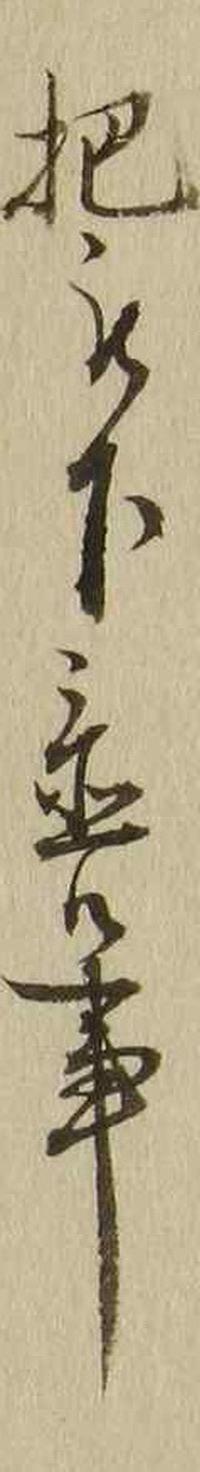把被下置候事
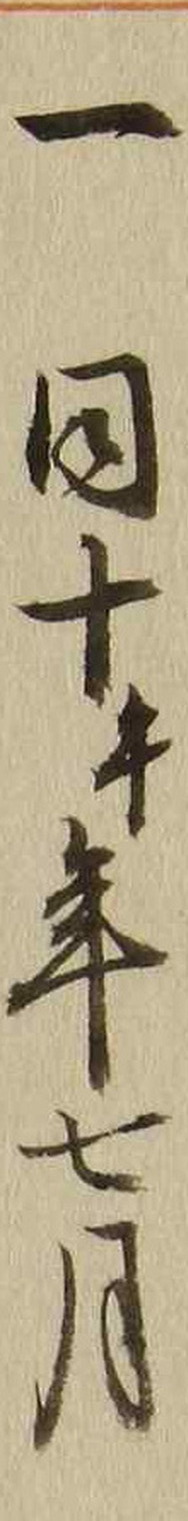一同十午年七月
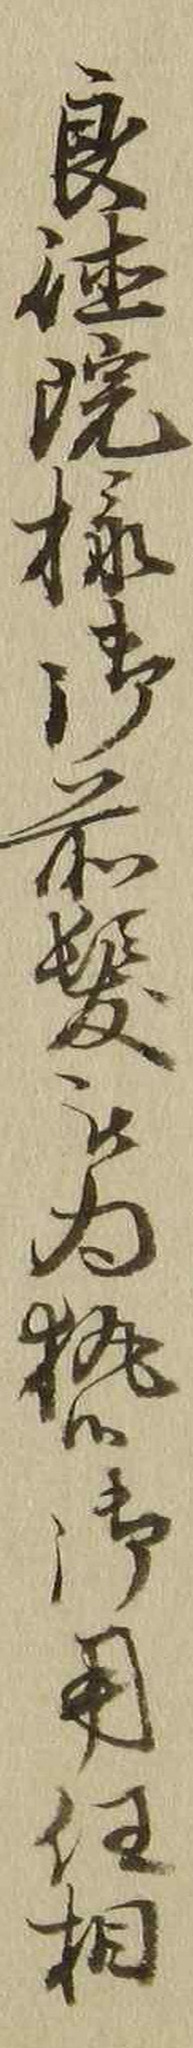良徳院様御前髪被為執候御用任相
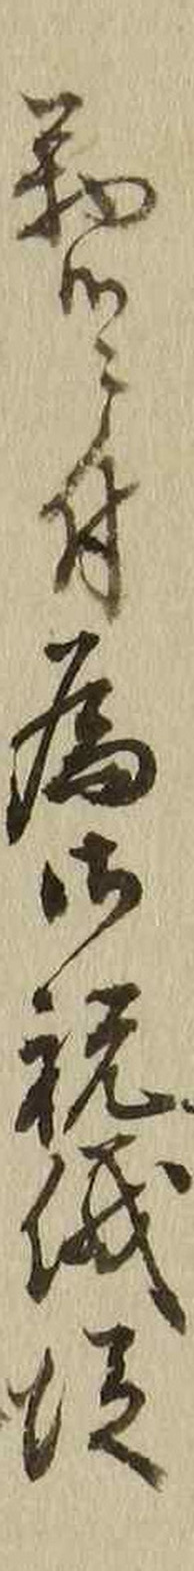勤候ニ付為御祝儀従
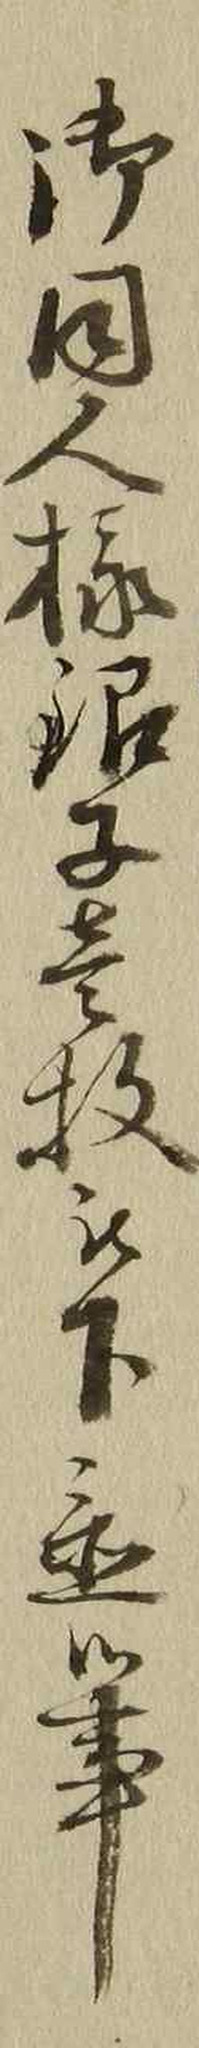御同人様銀子壱枚被下置候事
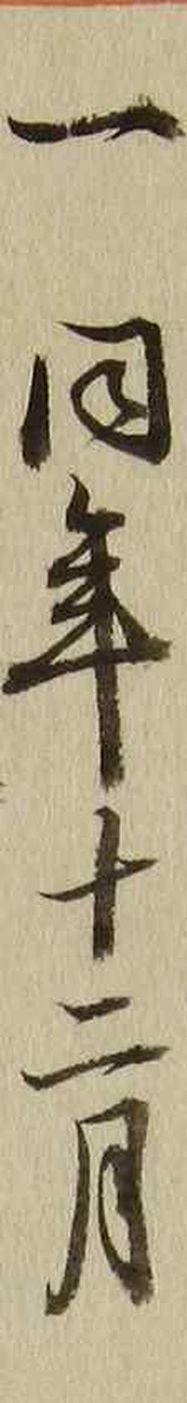一同年十二月
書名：諸士系譜　巻之64　と之部7
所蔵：会津若松市立会津図書館
